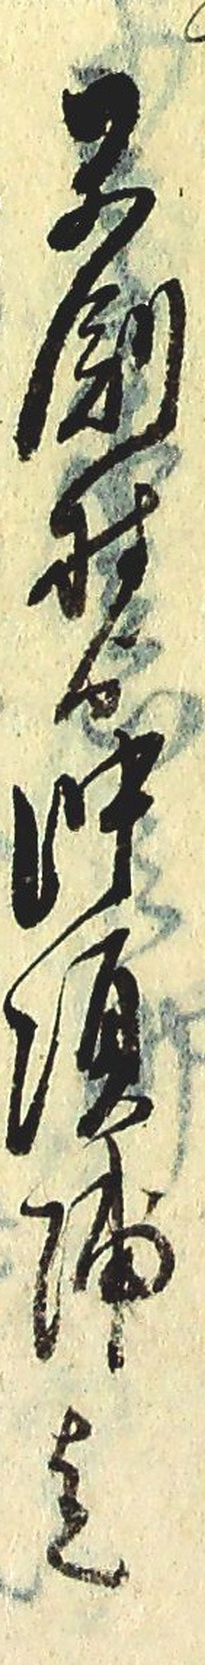早淵村ゟ沖須浦迄
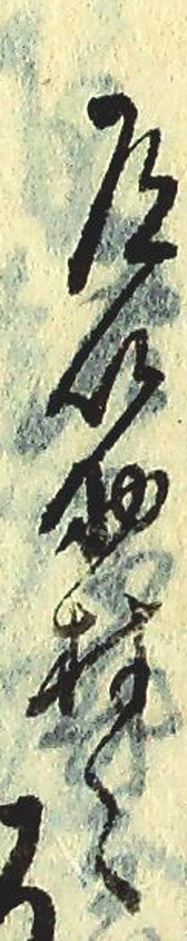道筋村々
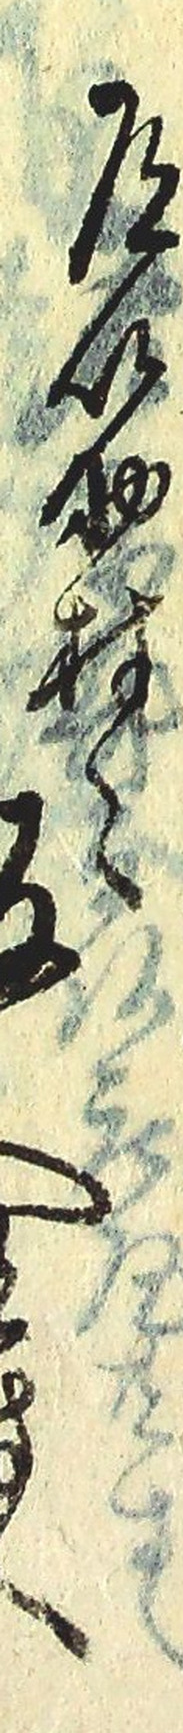道筋村々
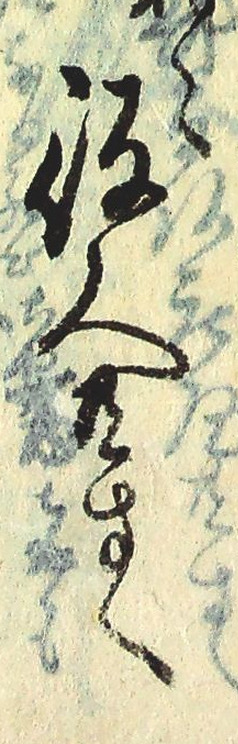役人共方へ

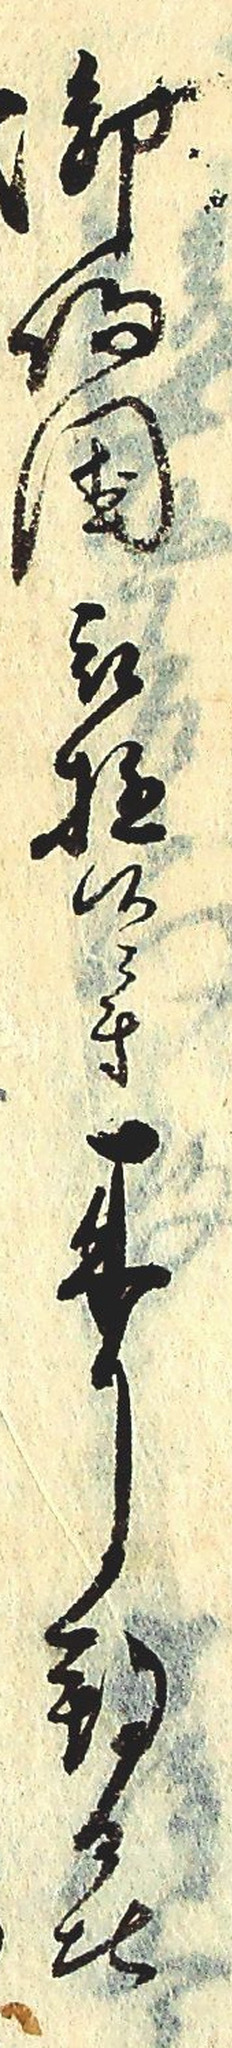御帰国被遊候に付来月朔日比
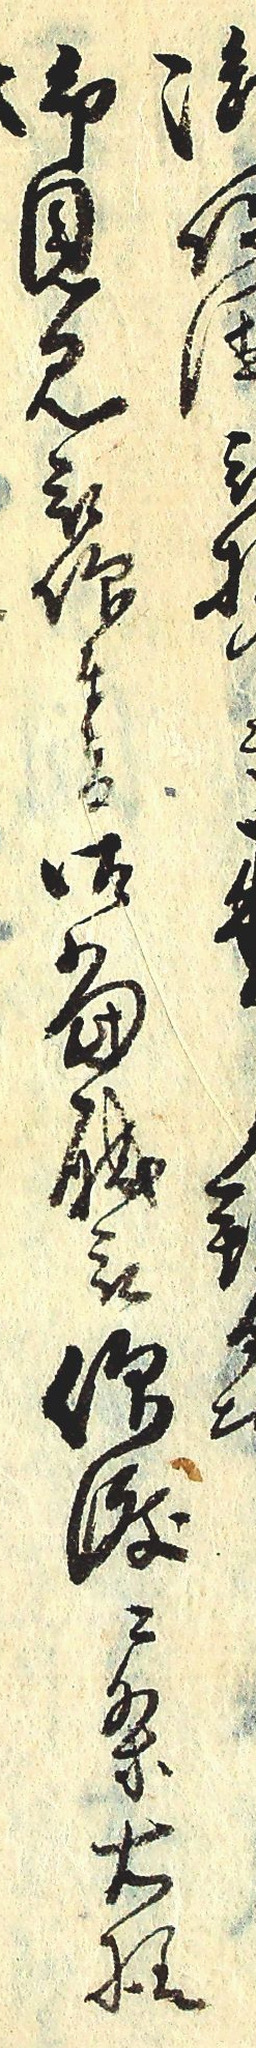御目見被仰付旨御当職被仰渡候条右様
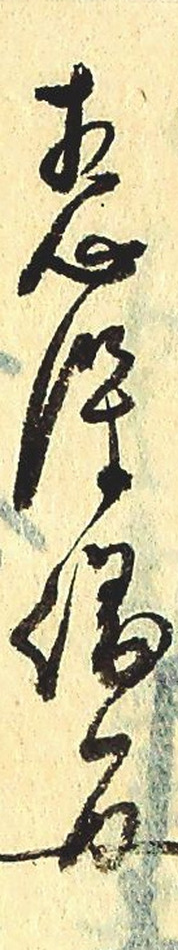相心得例毎
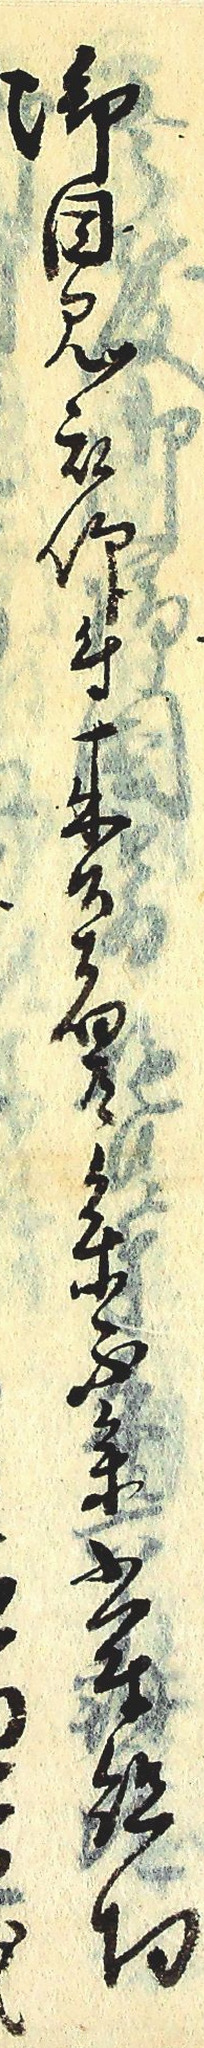御目見被仰付来候者共参不参書付組切
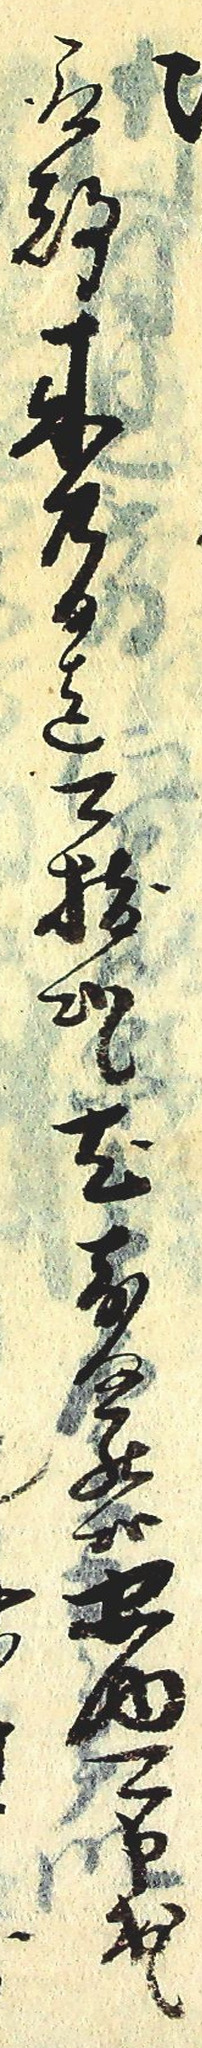取都め来廿日迄可指出候尤前日罷出安内可申出候
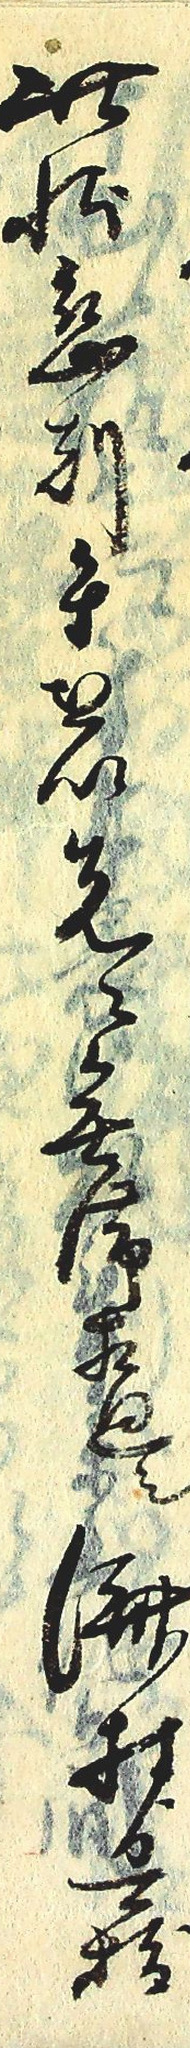此状急刻付を以先々無滞相廻し済村ゟ可指
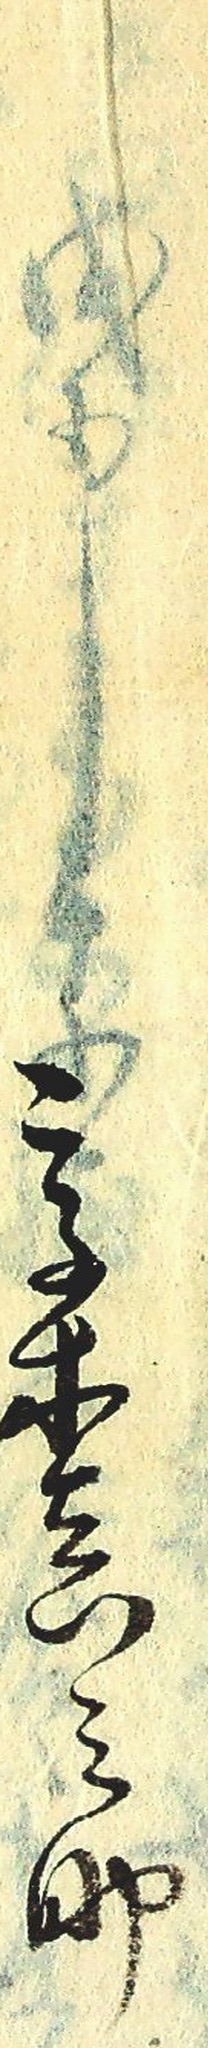高木真之助
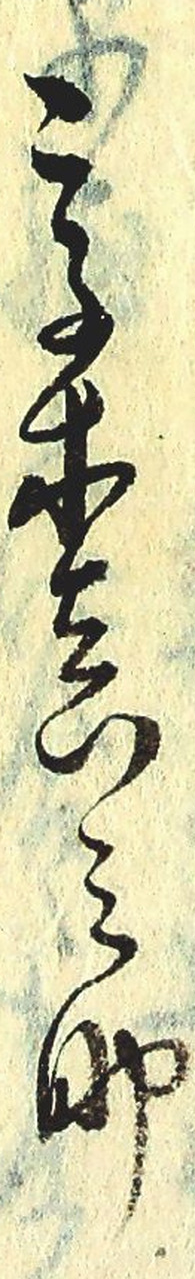高木真之助
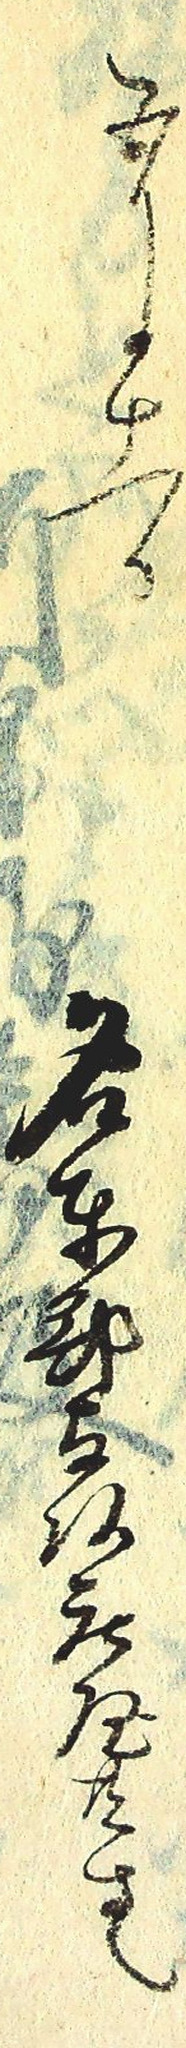五月十一日名東郡与頭庄屋共方へ
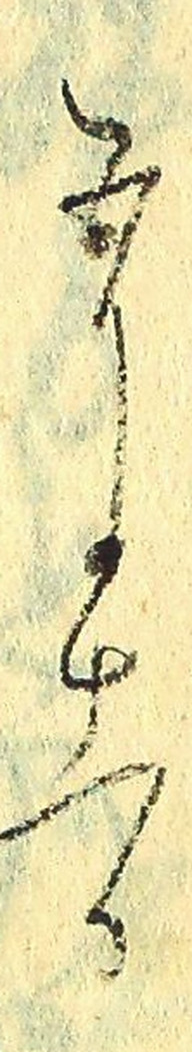五月十二日
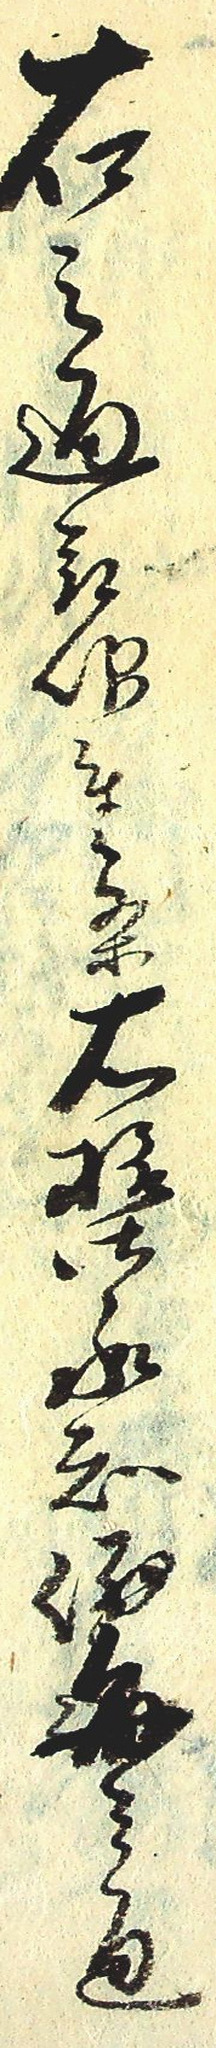右之通被仰付候条右様御承知例毎之通
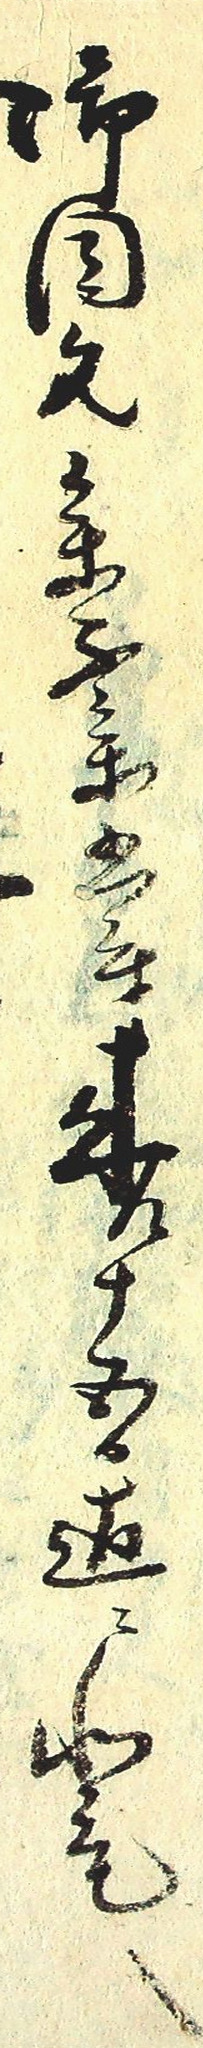御目見参不参書付来る十五日迄に私宅へ
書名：諸御願書控(弐番）
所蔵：鳴門教育大学 Naruto University of Education
